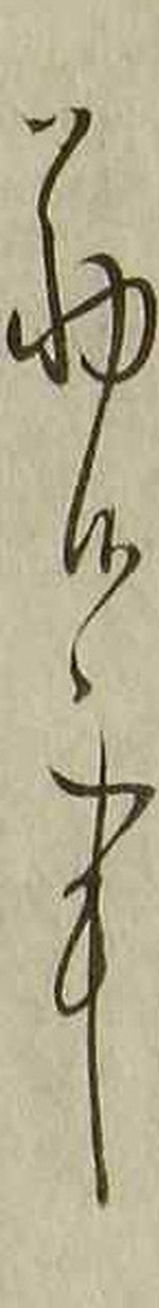勤候事
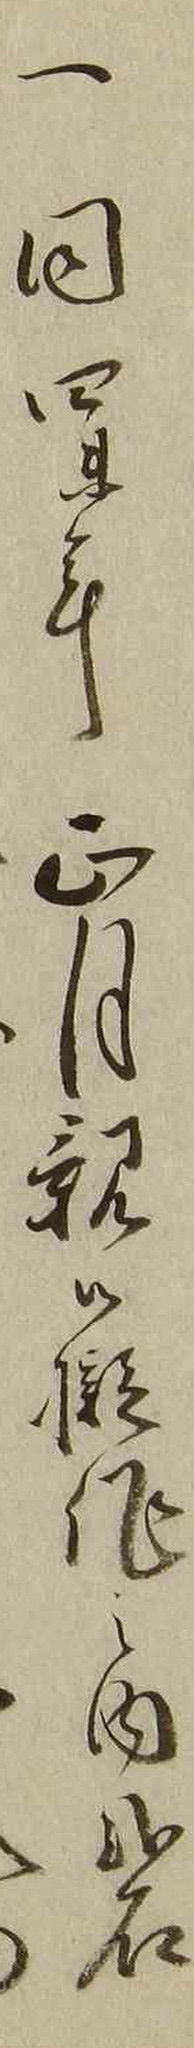一同四未年正月親御擬作之内弐石
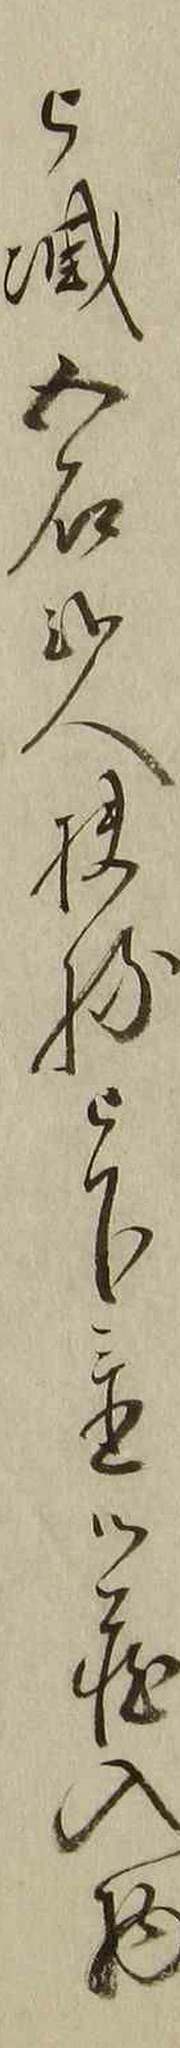被減五石弐人扶持被下置御蔵入物
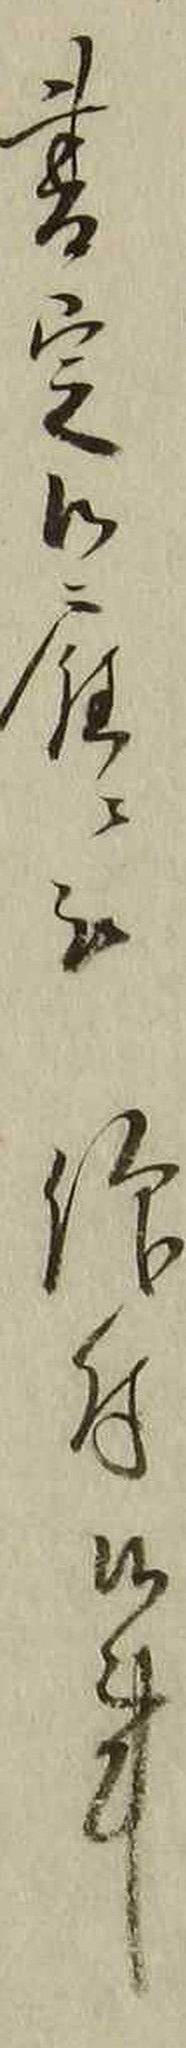書定御雇ニ被仰付候事
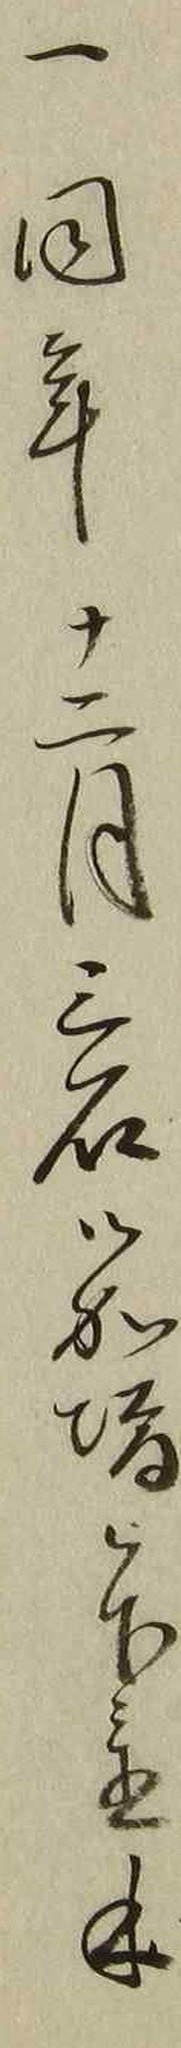一同年十二月三石御加増被下置本
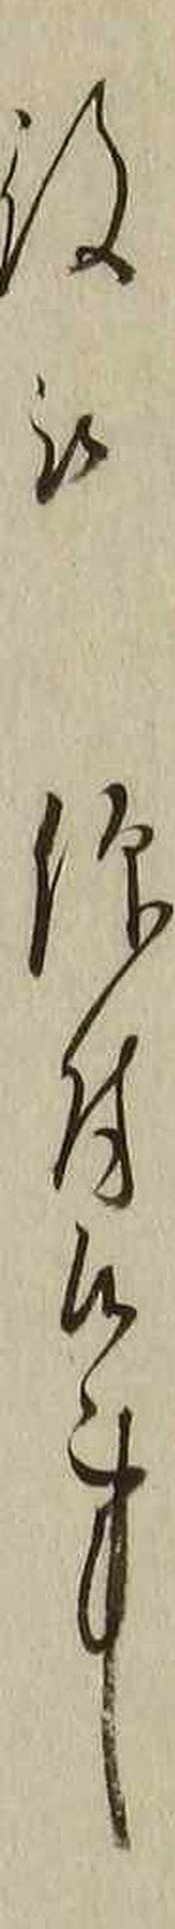役被仰付候事
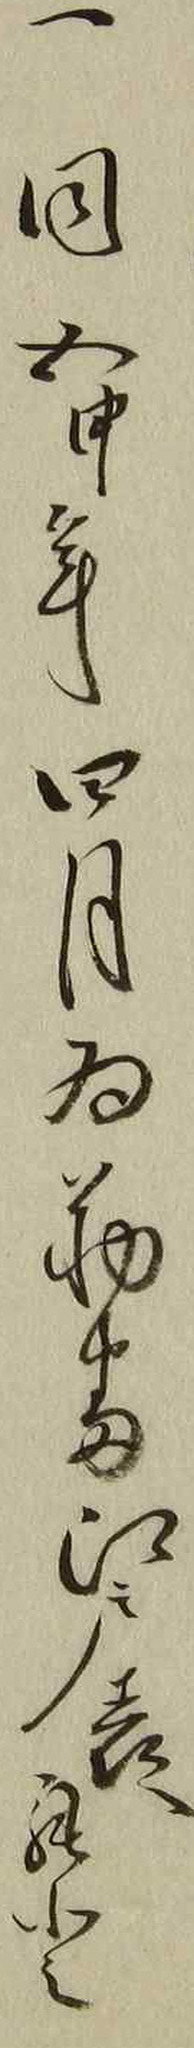一同五申年四月為勤番江戸表へ罷登
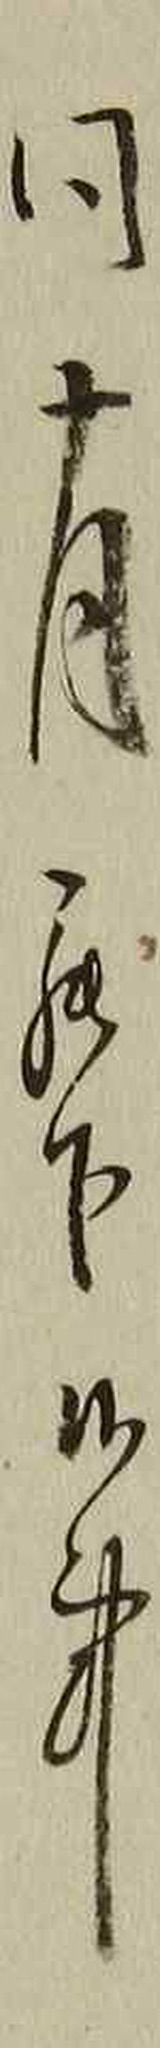同十月罷下候事
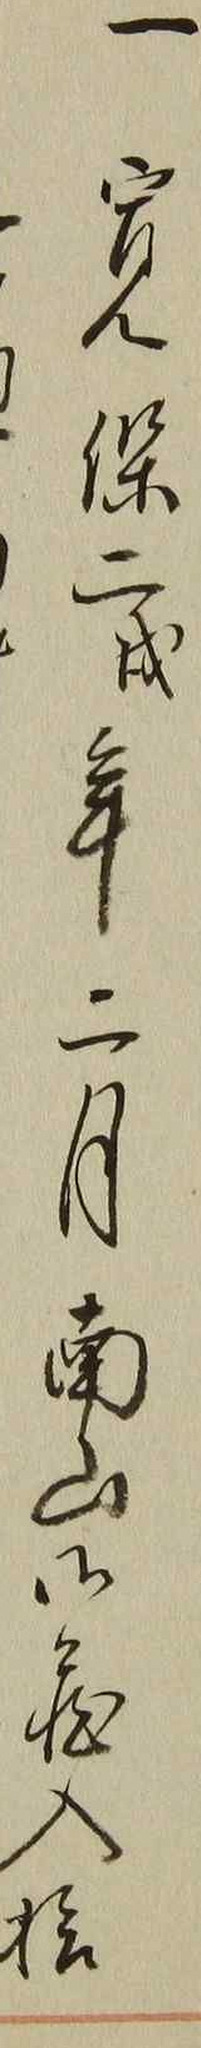一寛保二戌年二月南山御蔵入拾
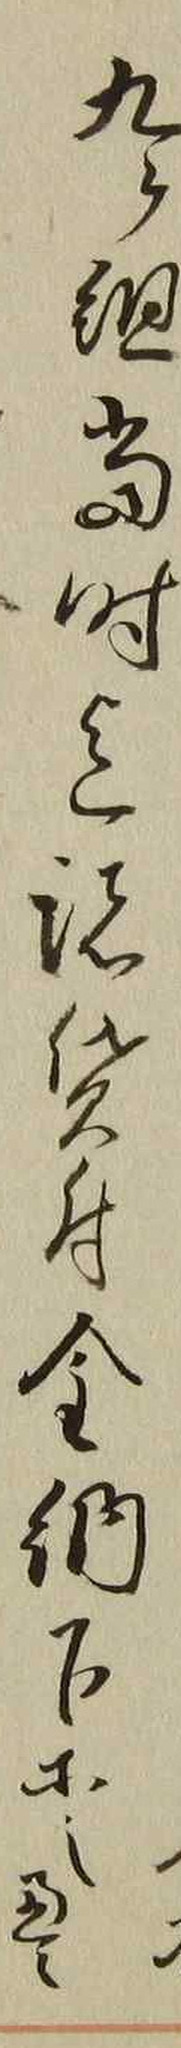九ケ組当時迄諸貸付金納下等之畳
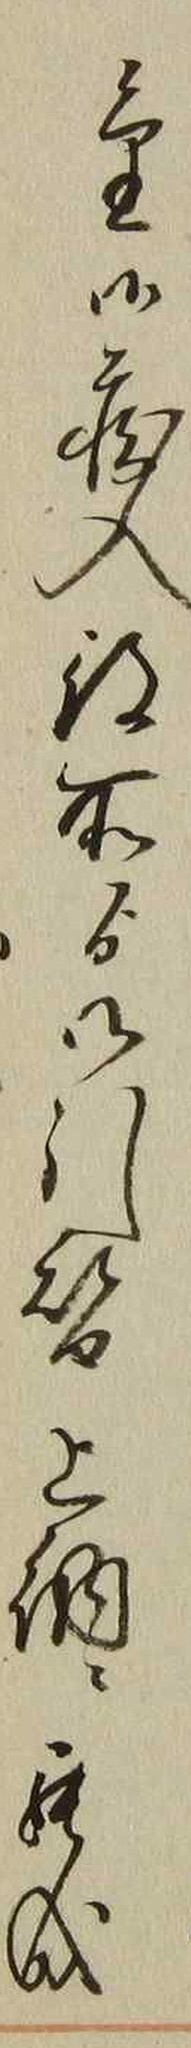金御蔵入役所ゟ御引替上納ニ罷成
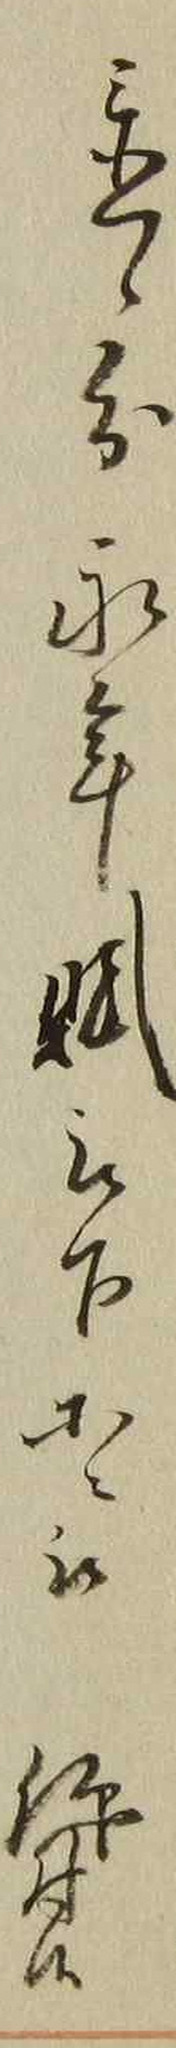置候分永年賦被下等ニ被仰付候
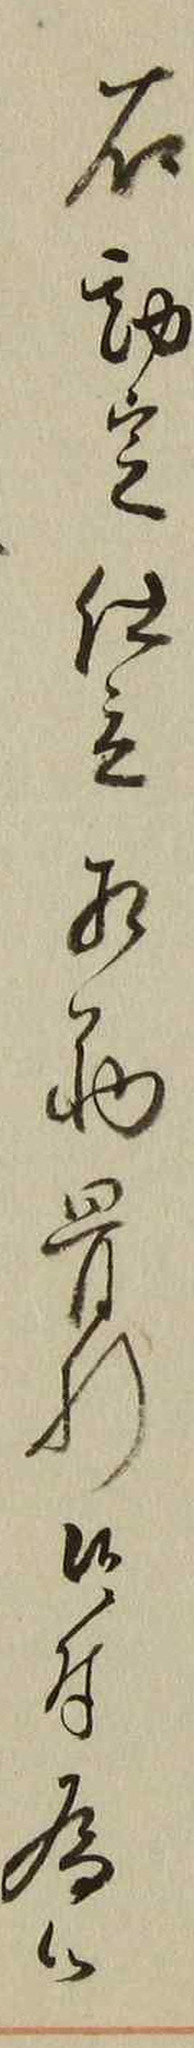右勘定仕立相勤骨折候ニ付為御
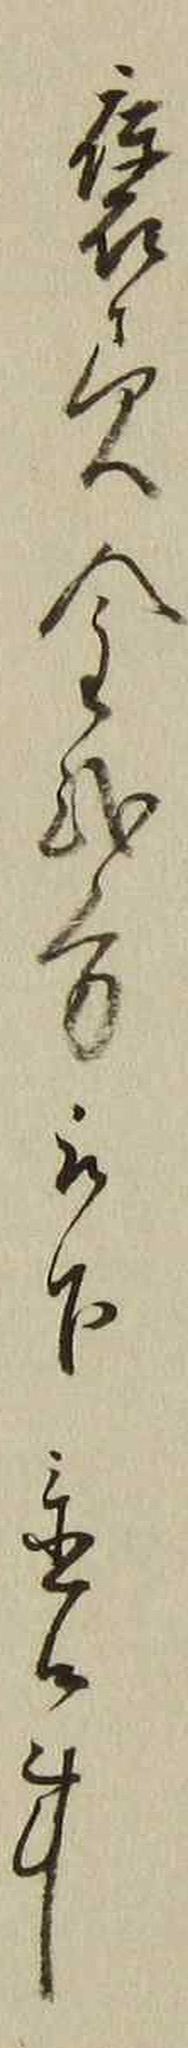褒美金弐分被下置候事
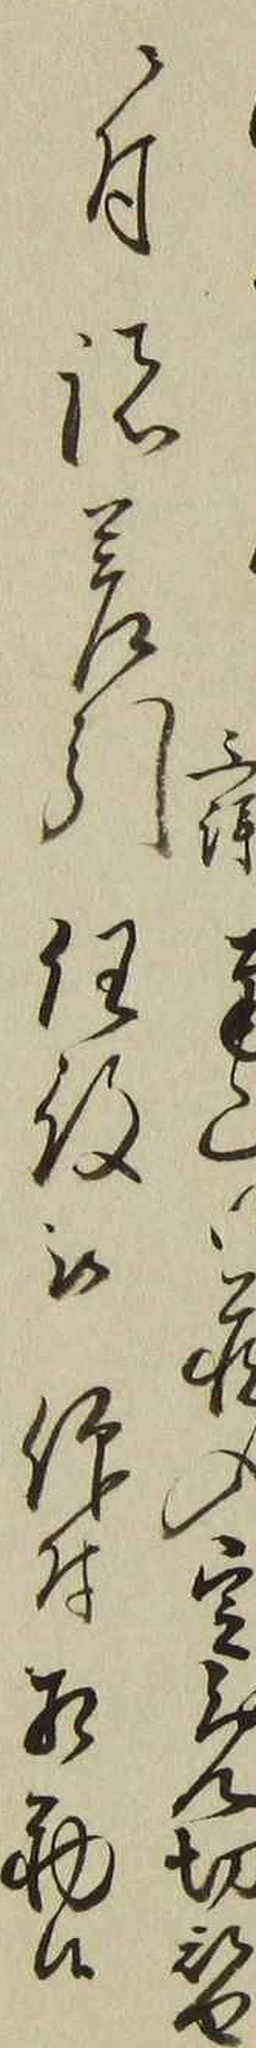ニ付諸差引任役被仰付相勤候
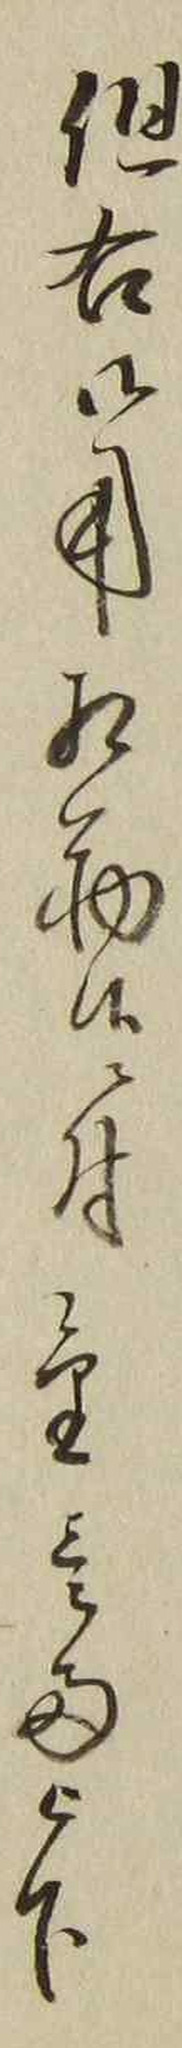但右御用相勤候ニ付金壱両被下
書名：諸士系譜　巻之132　た之部8
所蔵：会津若松市立会津図書館
